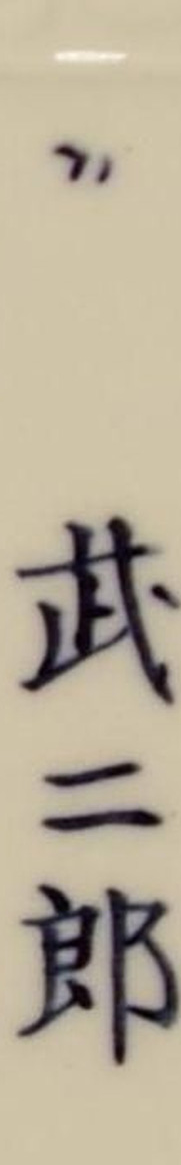武二郎
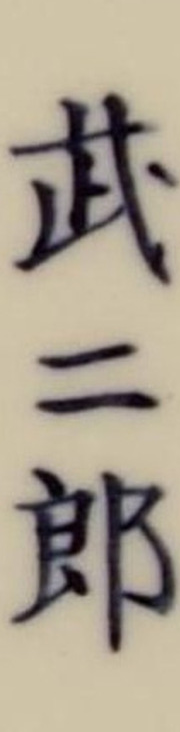武二郎
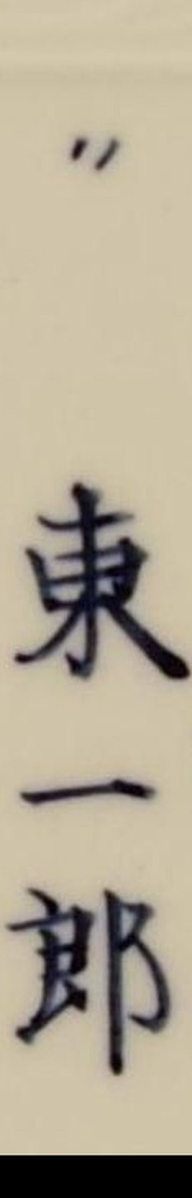東一郎
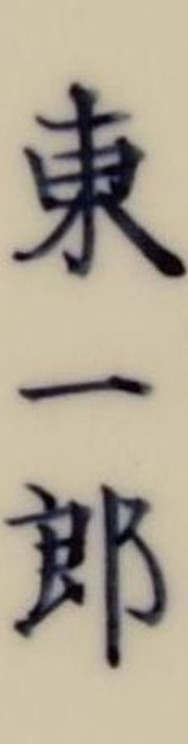東一郎
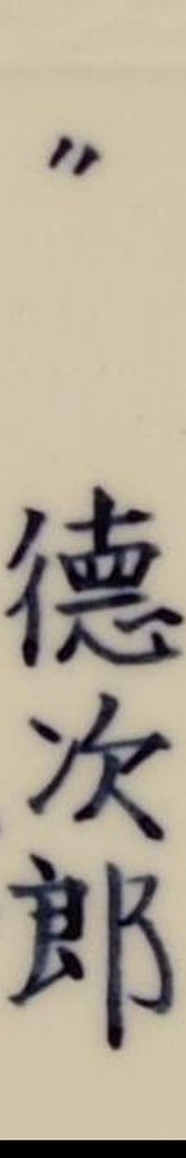徳次郎
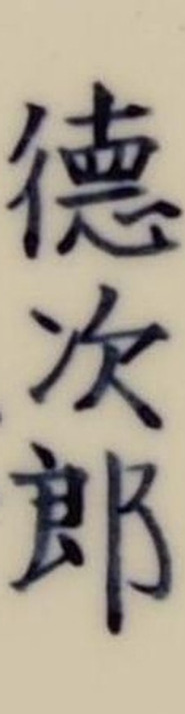徳次郎
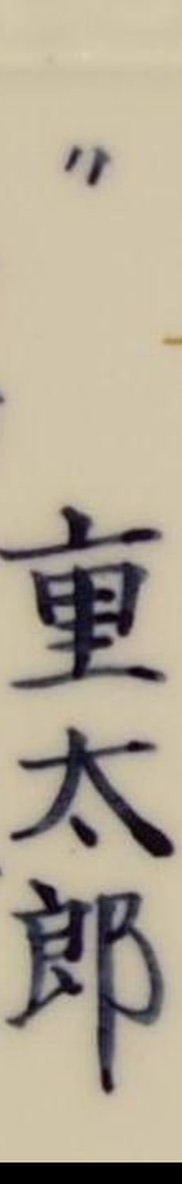重太郎
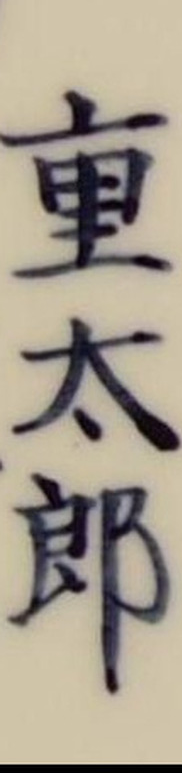重太郎
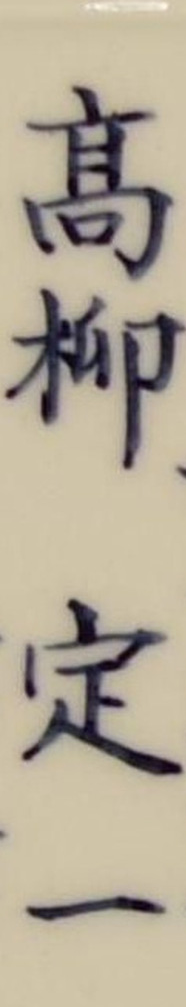高柳定一
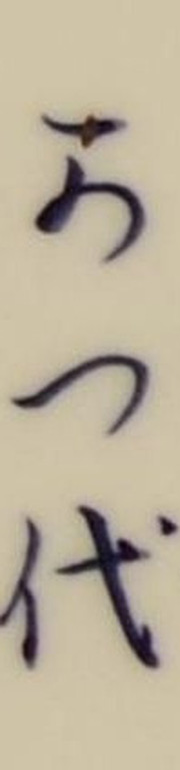かつ代
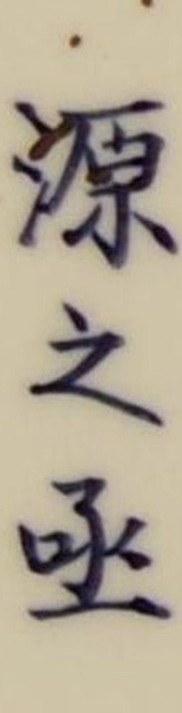源之丞
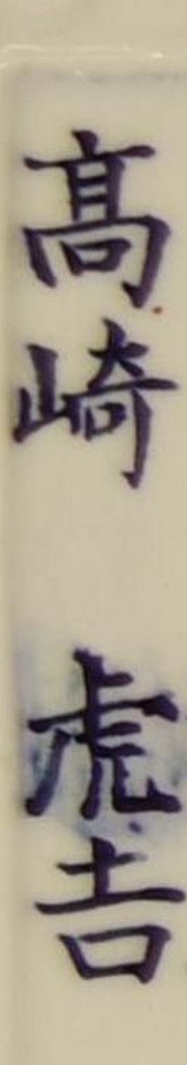高崎虎吉

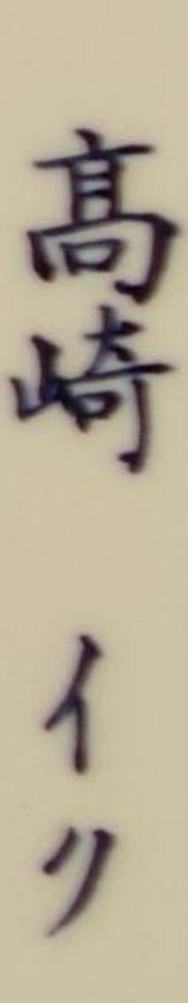高崎イク
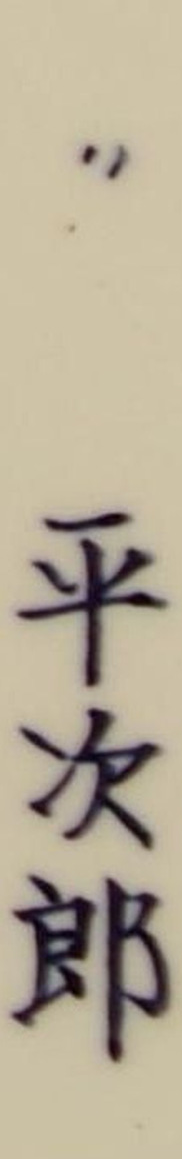平次郎
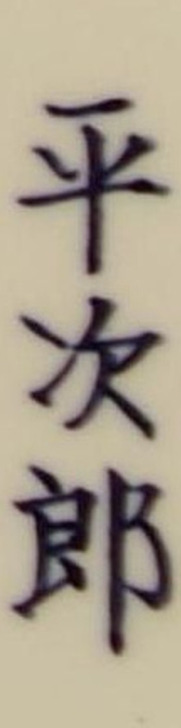平次郎
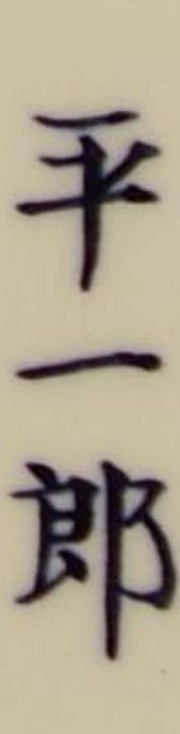平一郎
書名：E~L
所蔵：高野山金剛峯寺
